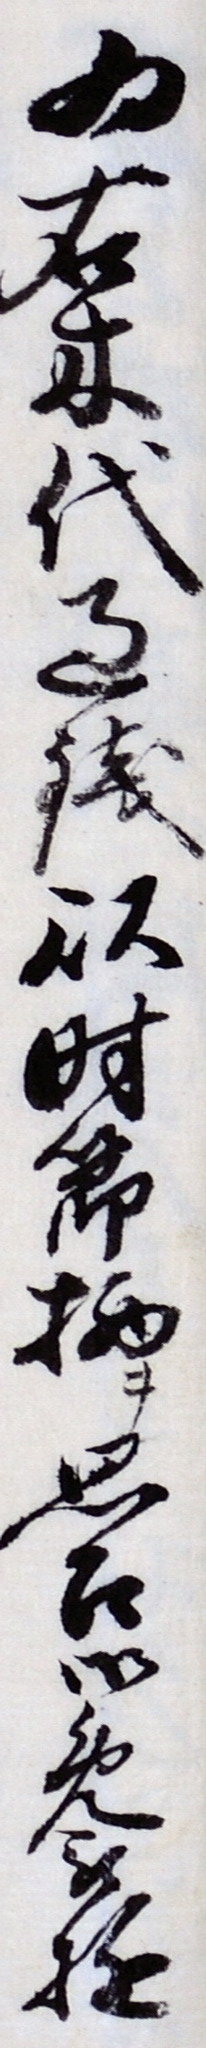為右木代過銭以時節柄ヲ思召御免被遊
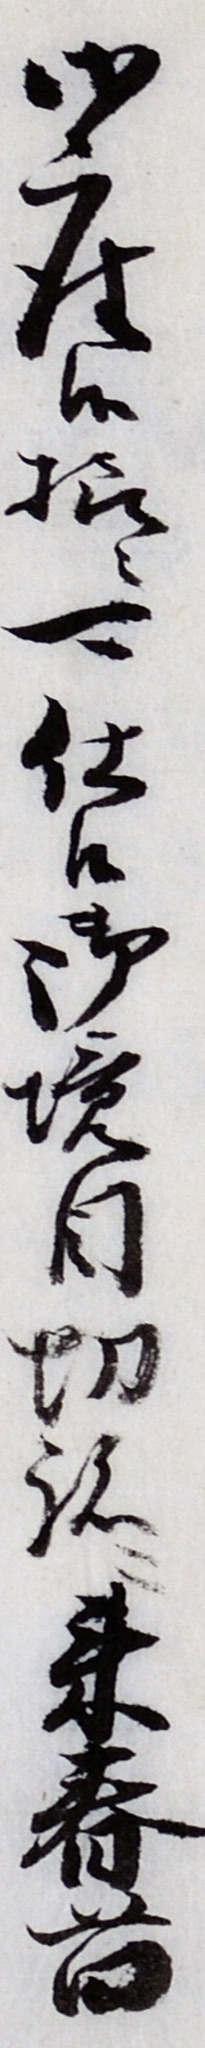御座候様ニ可仕候御境目切跡ニ来春苗
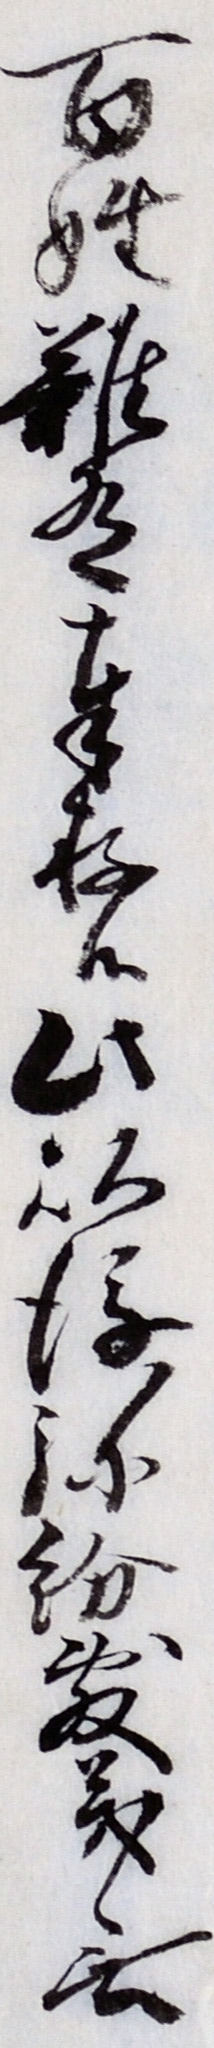百姓難有奉存候此以後弥紛敷儀義無
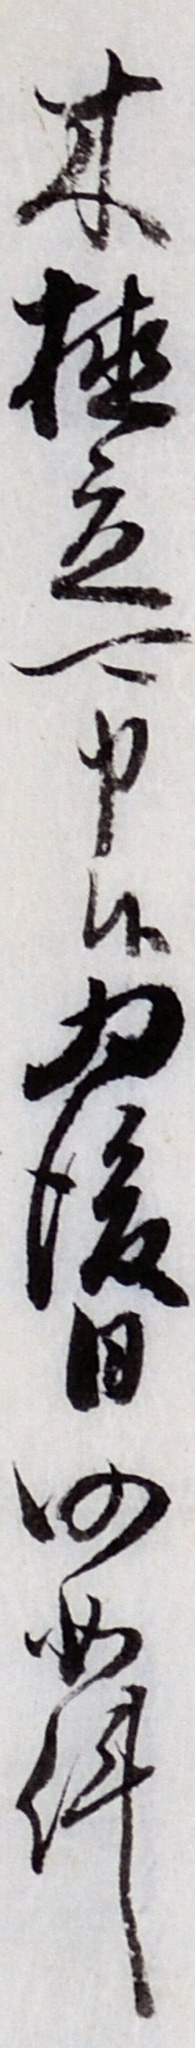木植立可申候為後日仍如件
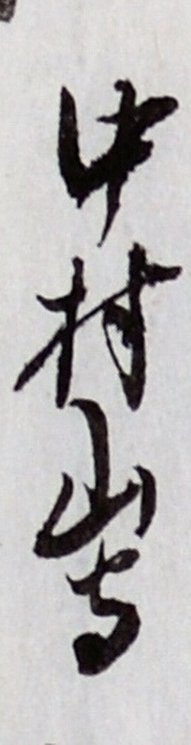中村山守

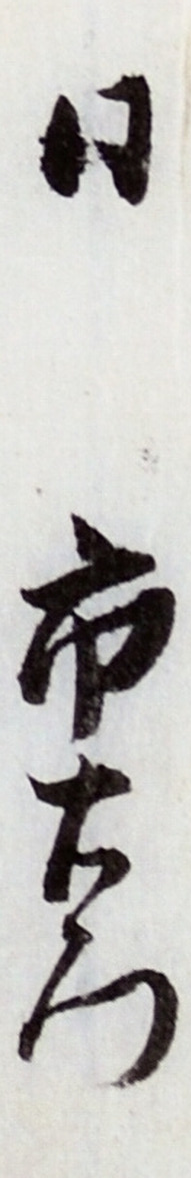同市右衛門
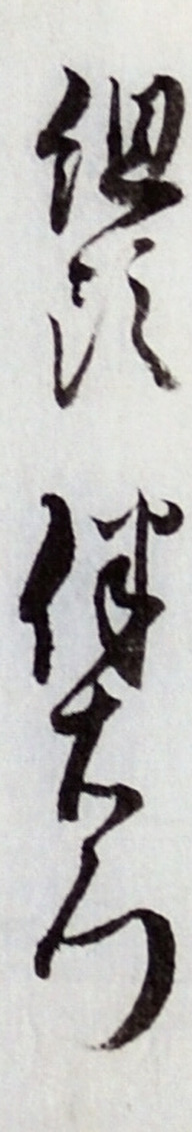組頭伴右衛門
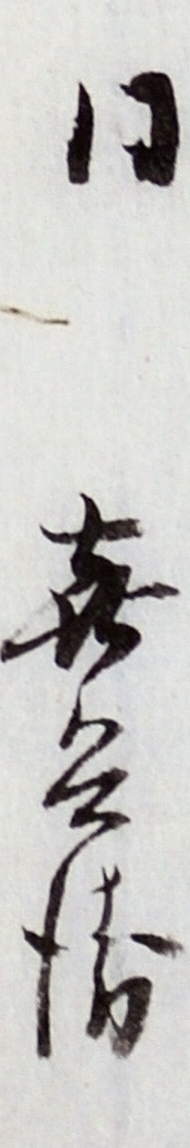同喜兵衛
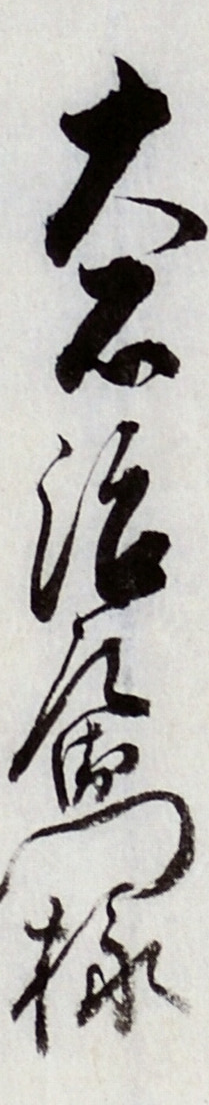大石治左衛門様
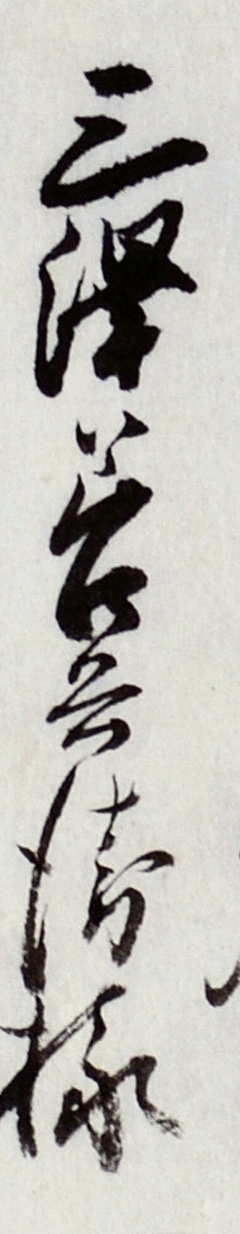三沢善兵衛様
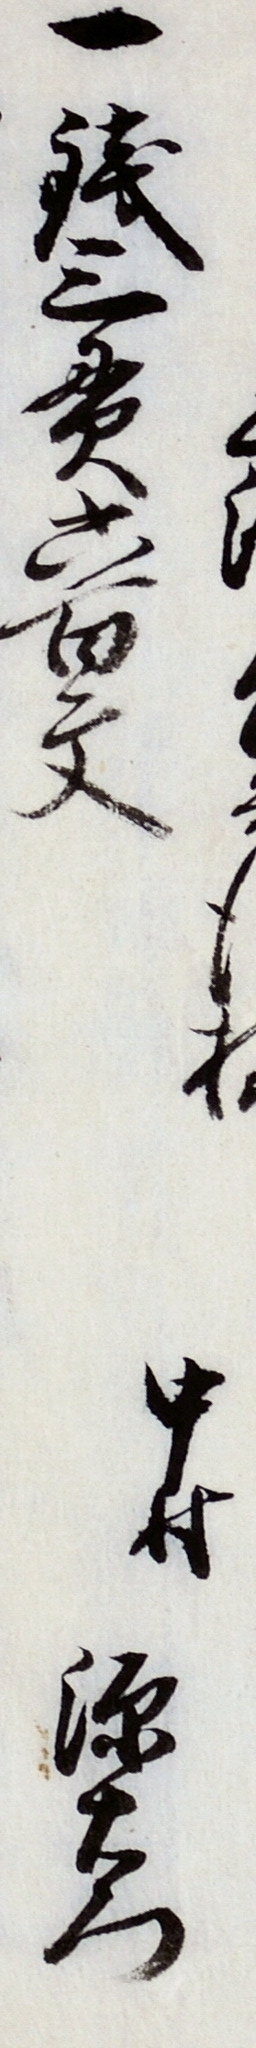一銭三貫六百文中村源右衛門
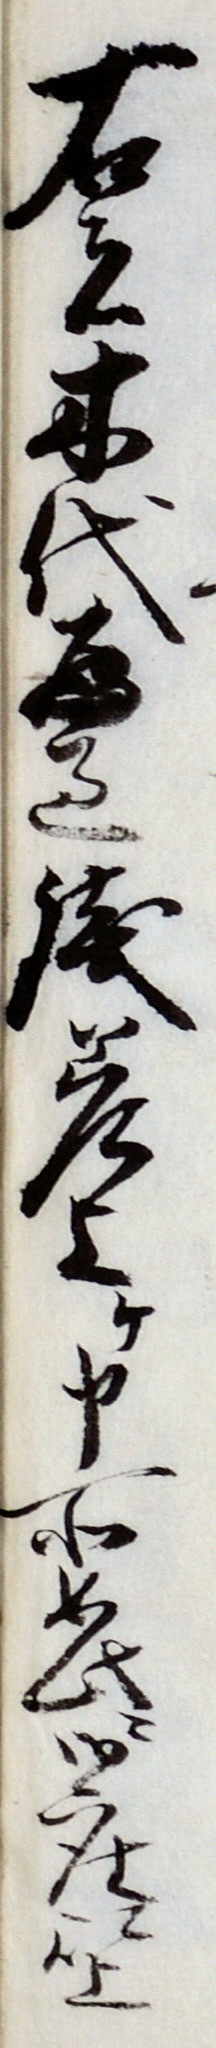右者木代為過銭差上ヶ申所如此ニ御座候以上
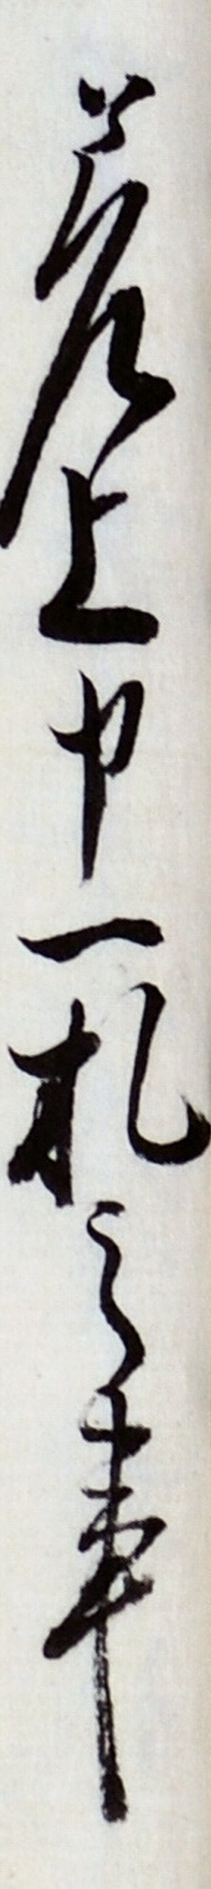差上申一札之事
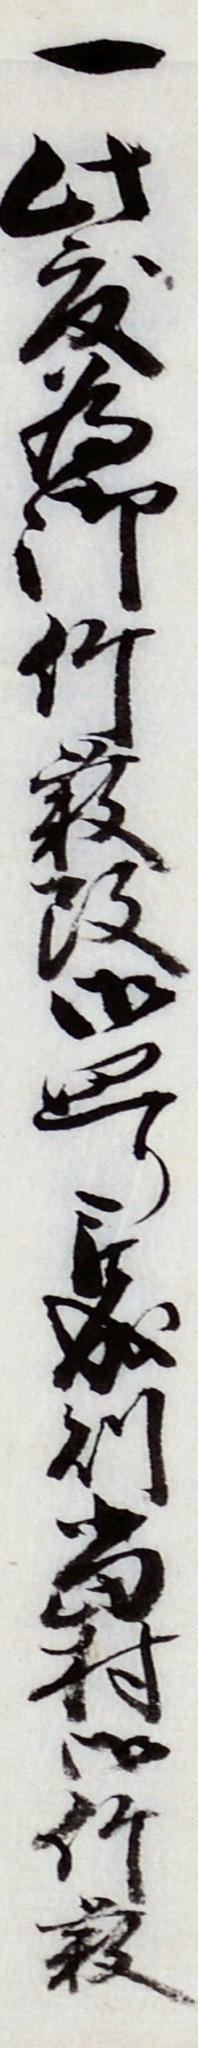一此度為御竹薮改御廻り被成則当村御竹薮
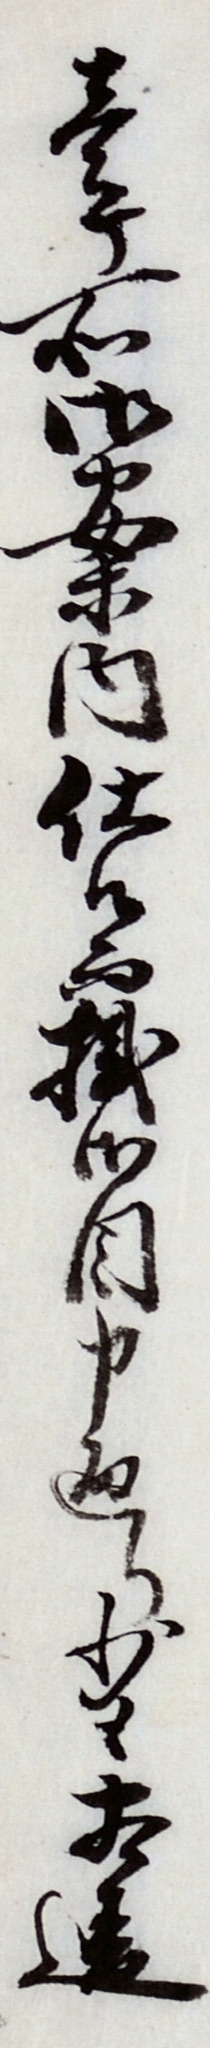壱ヶ所御案内仕候而掛御目申通り少も相違
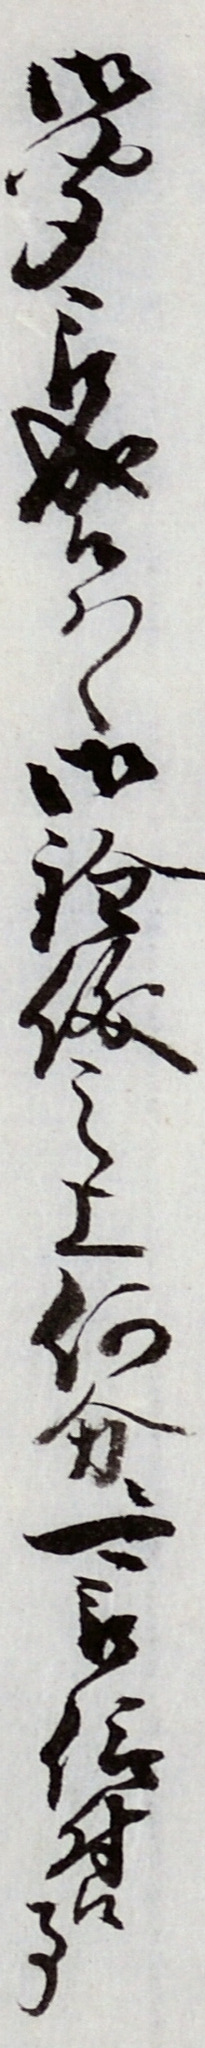御聞被成候ハヽ御詮儀之上何分ニ可被仰付候事
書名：御林御竹藪証文控
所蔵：伊那市立高遠町図書館・合同会社AMANE
